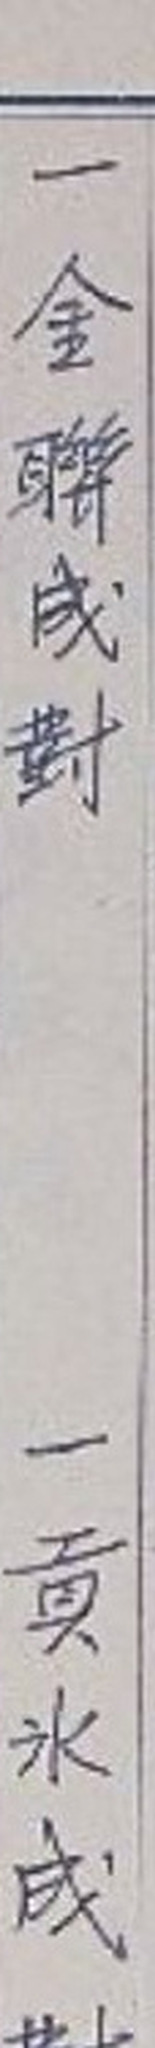一金聯成対一貢水成対
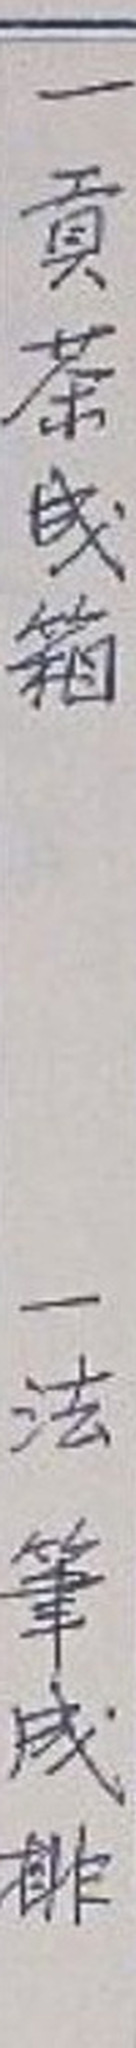一貢茶成箱一法筆成排
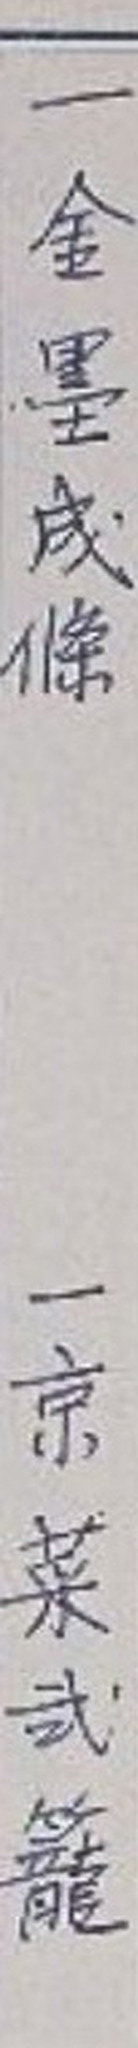一金墨成条一京菜弐籠
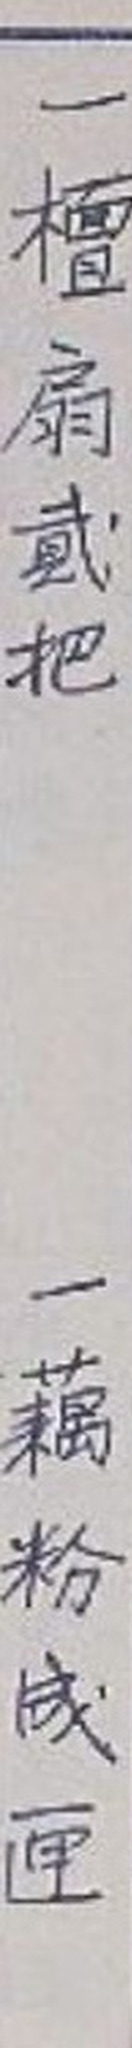一檀扇弐把一藕粉成匣
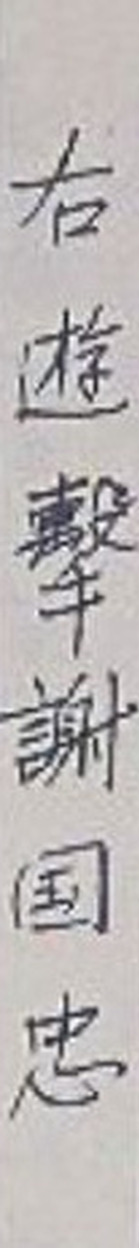右遊撃謝国忠
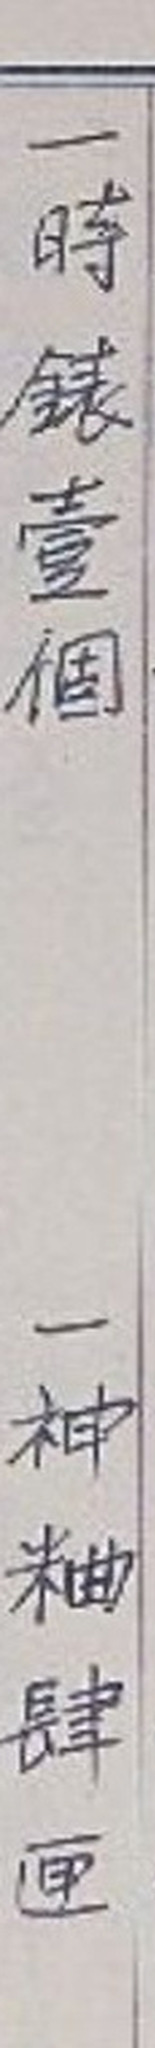一時錶壱個一神粬肆匣
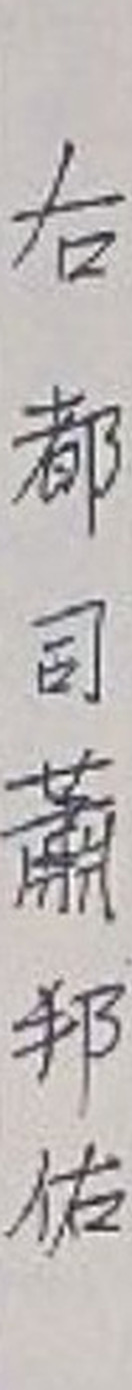右都司蕭邦佑
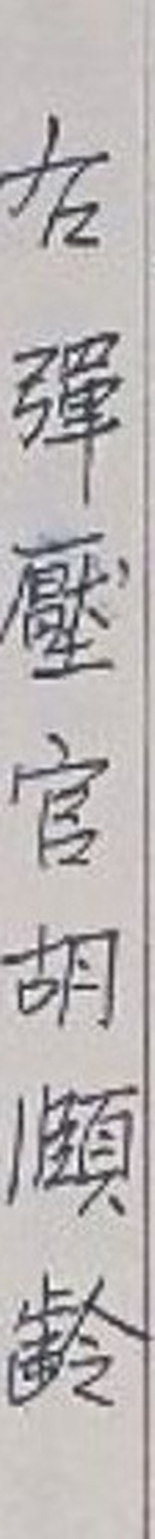右弾圧官胡頥齢
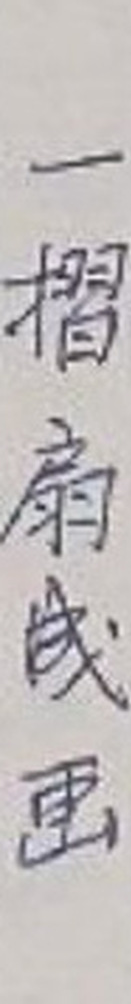一芽茶成箱一摺扇成画
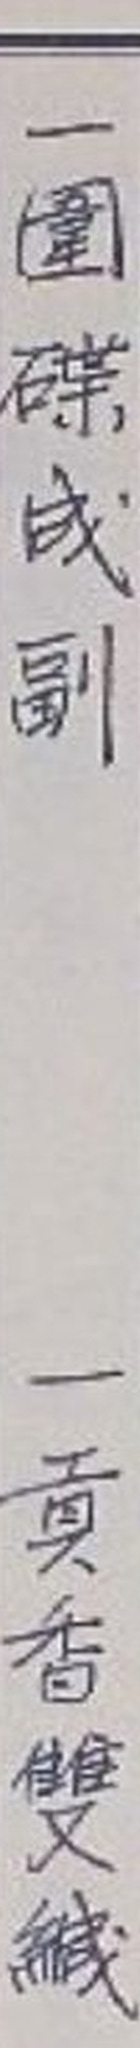一囲碟成副一貢香雙緘
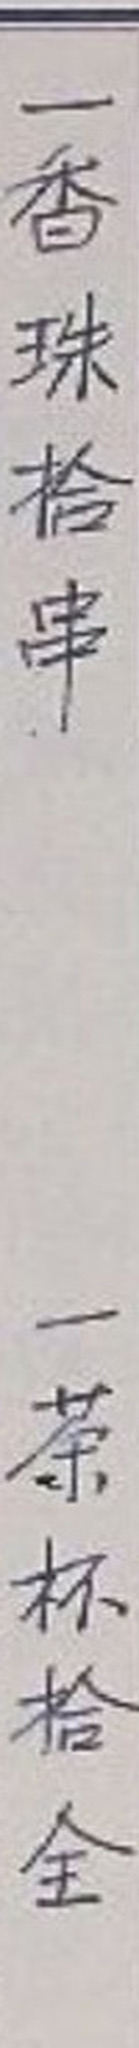一香珠拾串一茶杯拾全
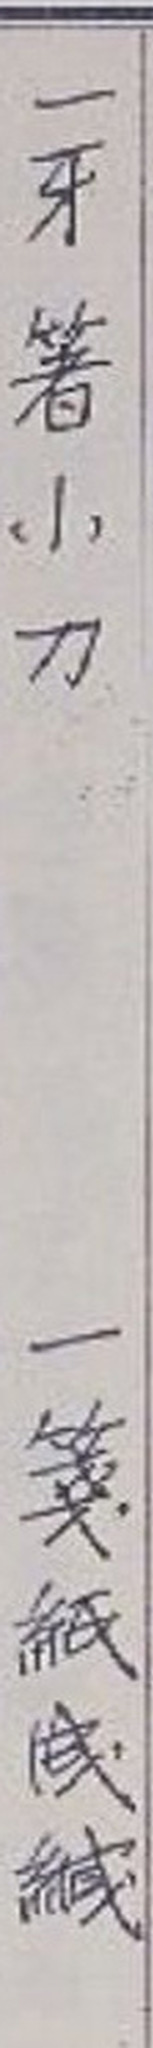一牙箸小刀一箋紙成緘
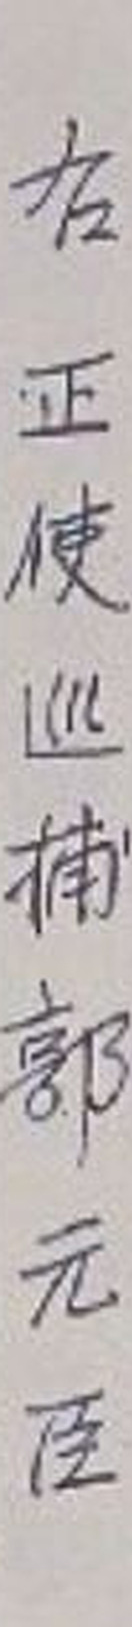右正使巡捕郭元臣
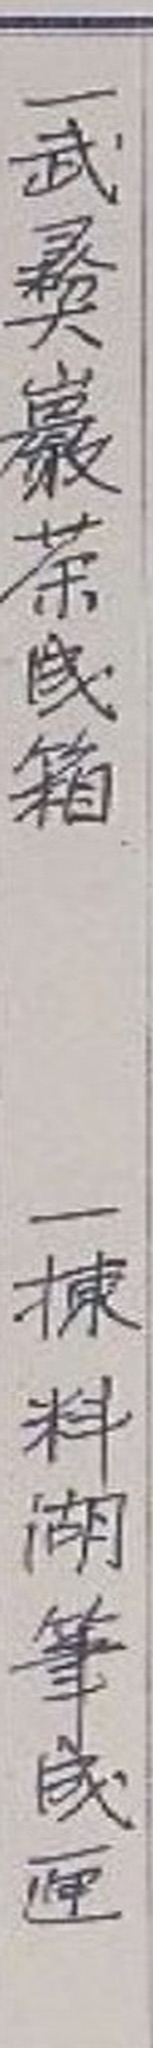一武彛巖茶成箱一揀料湖筆成緘

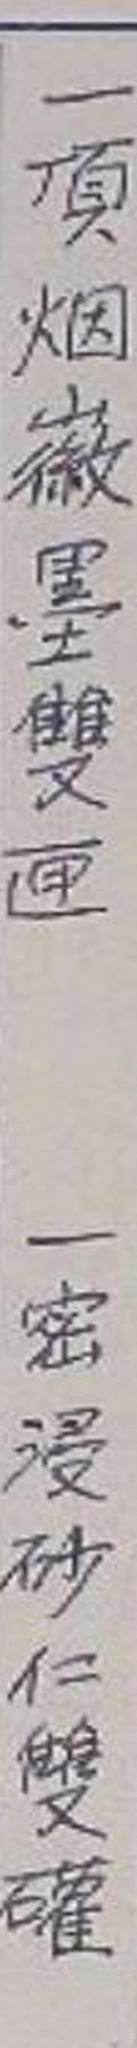一頂烟𡽪墨雙匣一密浸砂仁雙礶
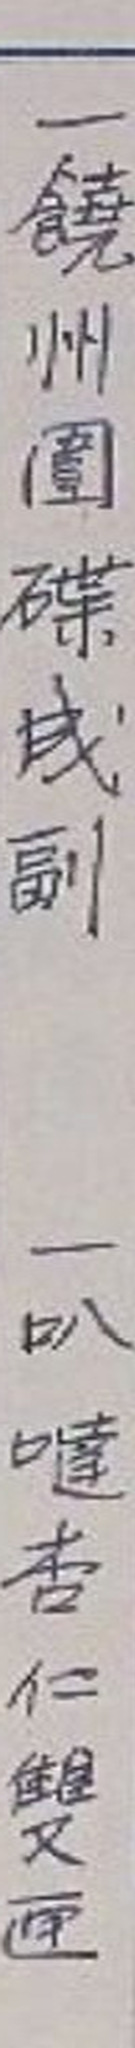一饒州囲碟成副一叭噠杏仁雙匣
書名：支那冊封使来琉諸記 下巻
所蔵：University of the Ryukyus Library
